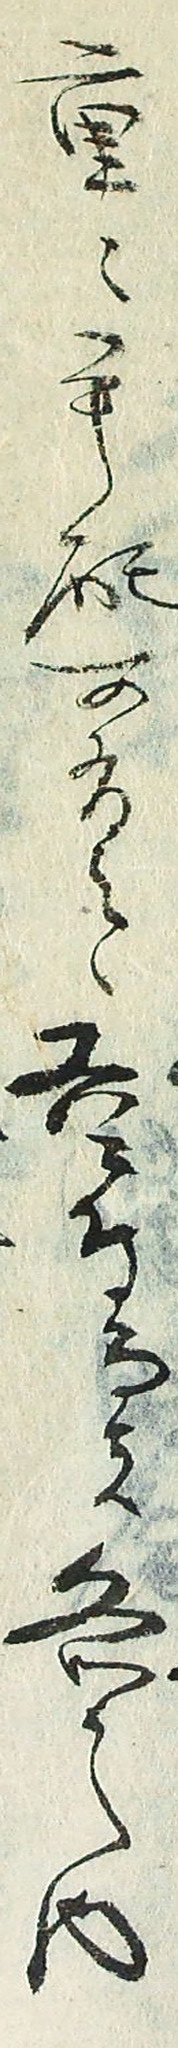重々手配可有之候右に付ては各之内
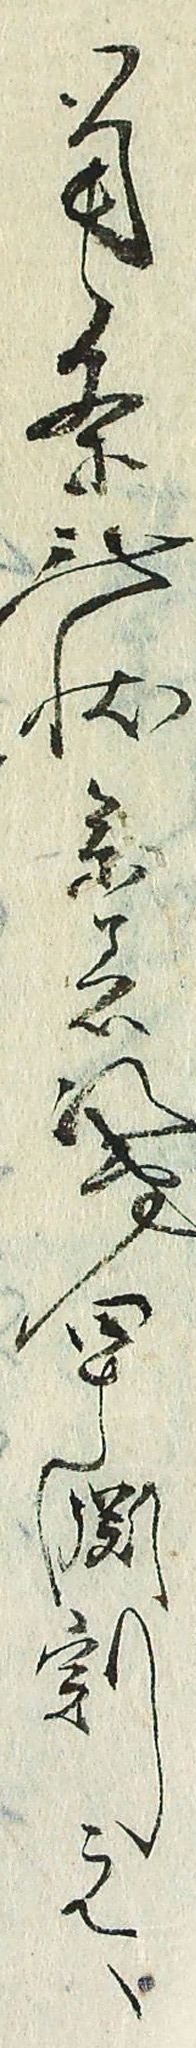御用候条此状参着次第早淵割元へ
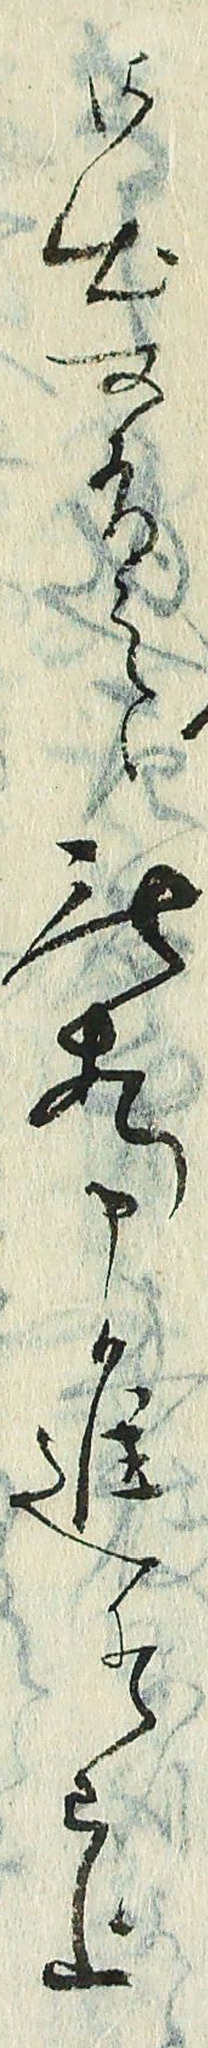御出可有之候此段申進候已上
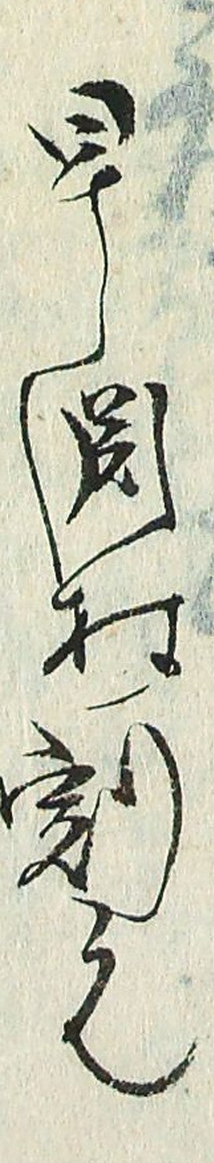早淵村割元
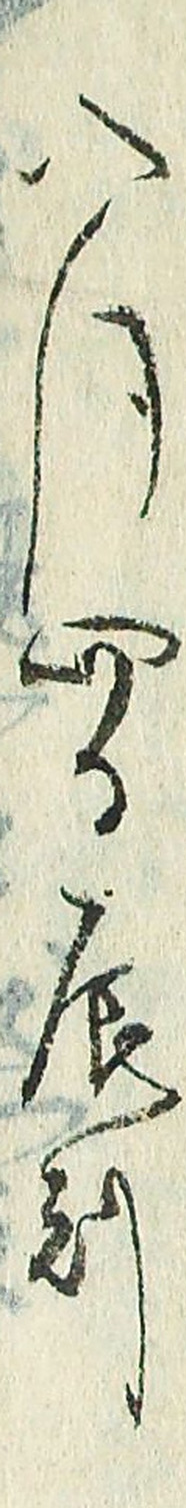八月四日辰刻
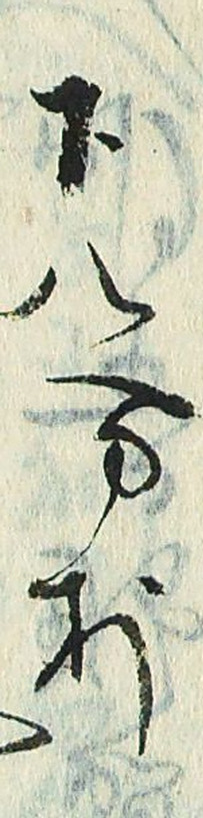下八万村
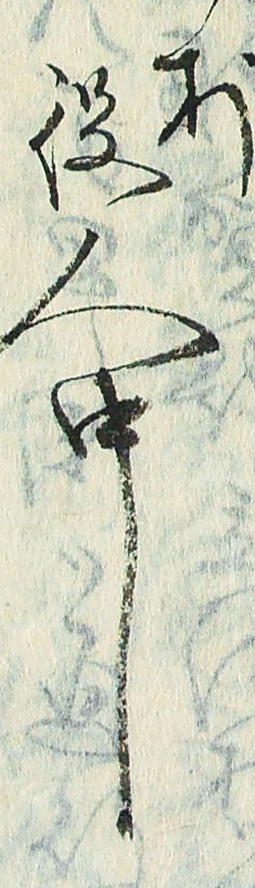役人中

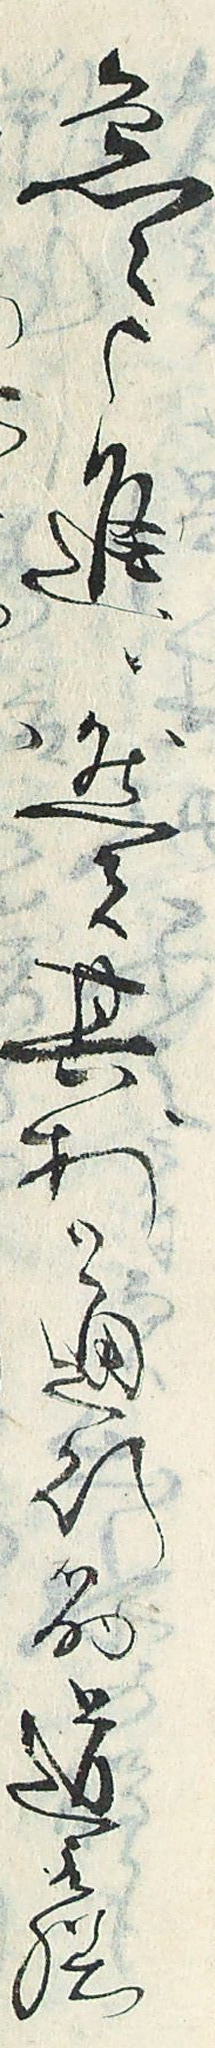急々申進候然は其村御通行筋道取繕
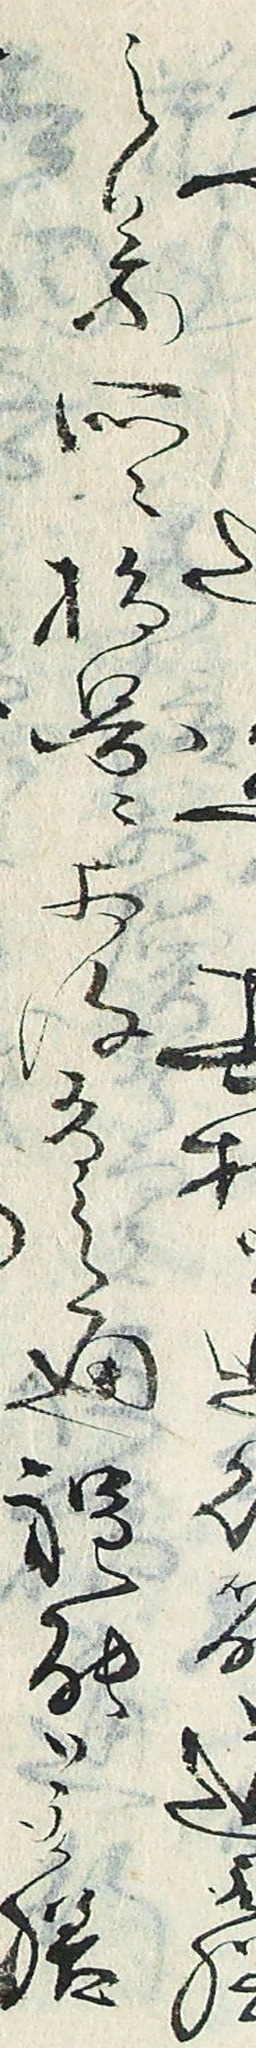之義所々指図に相及有之候通程能御取繕
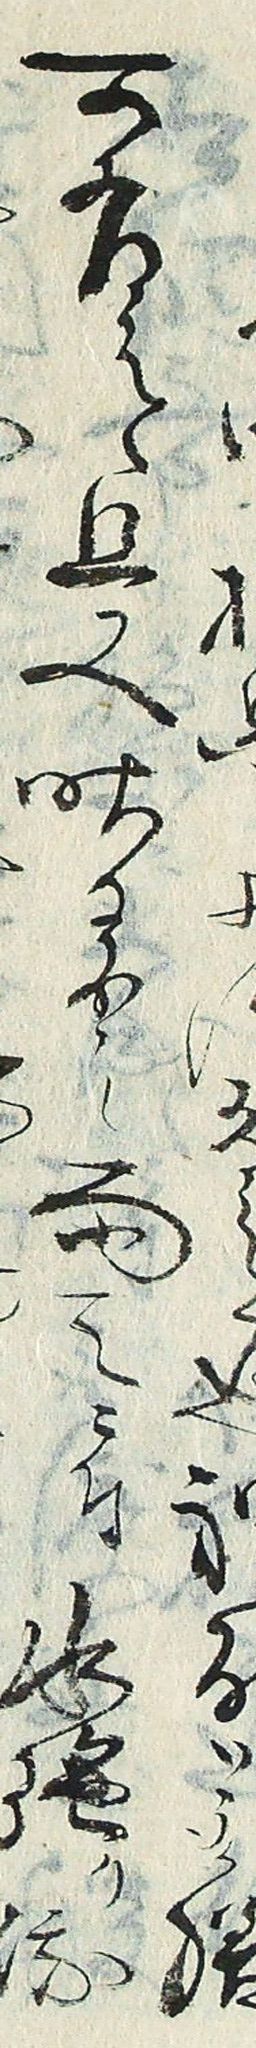可有之候且又昨日ゟ之雨天に付水強く流
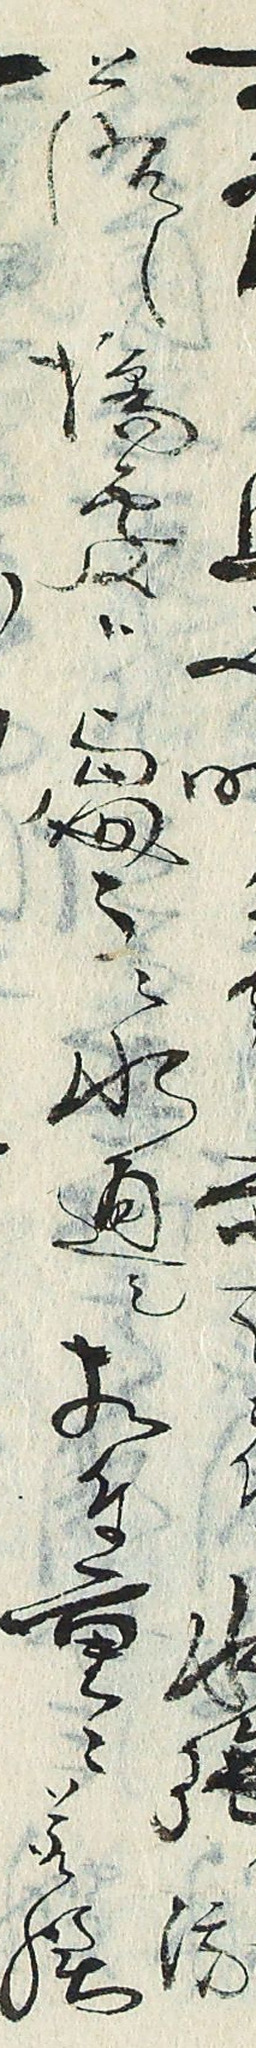落候場処は処々に水通し相付重々御取繕
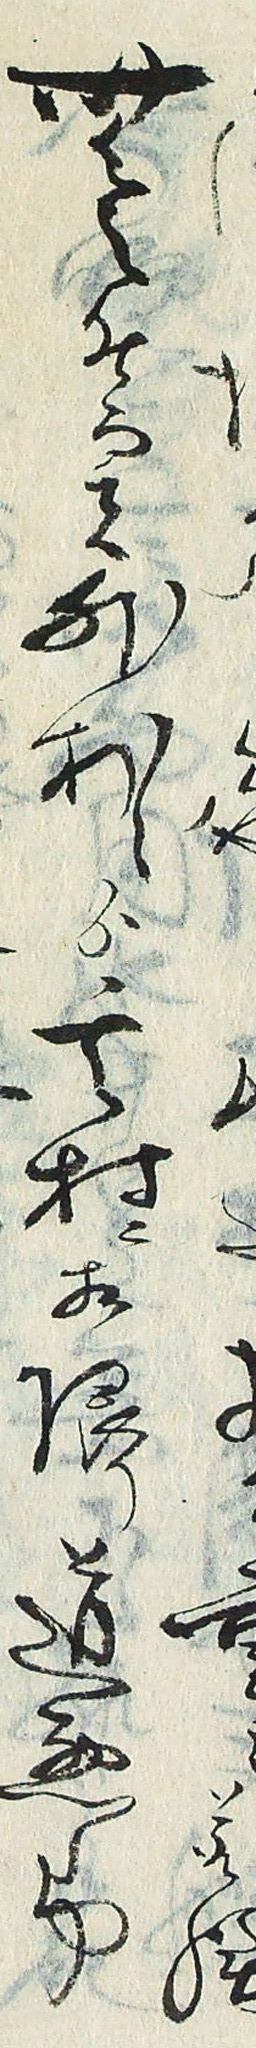無之候ては外村々ゟ其村に相限り道悪布
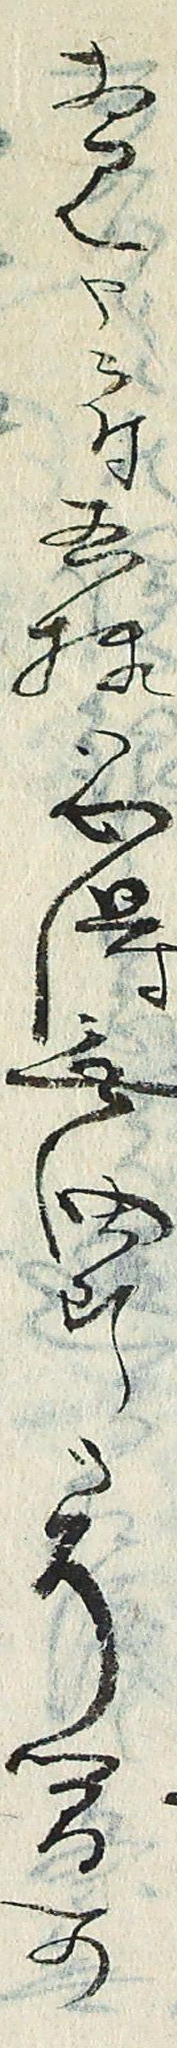相見申に付右様御心得無油断御了簡可
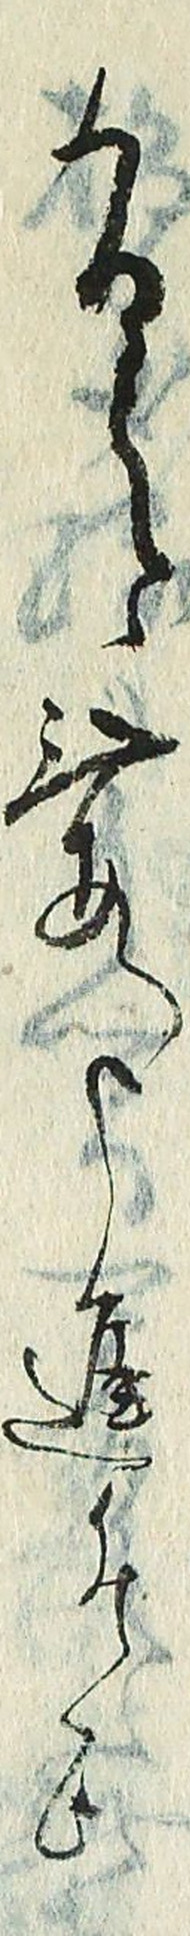有之候此段申進候以上
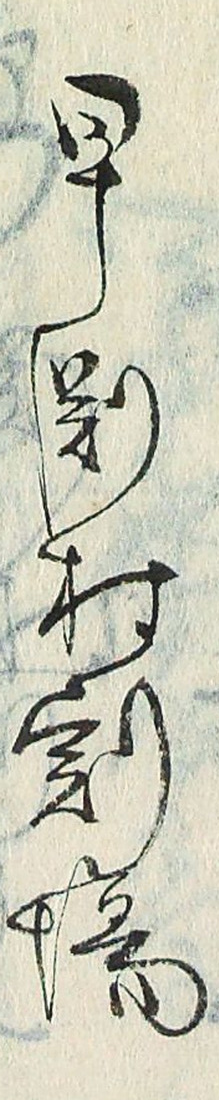早淵村割場
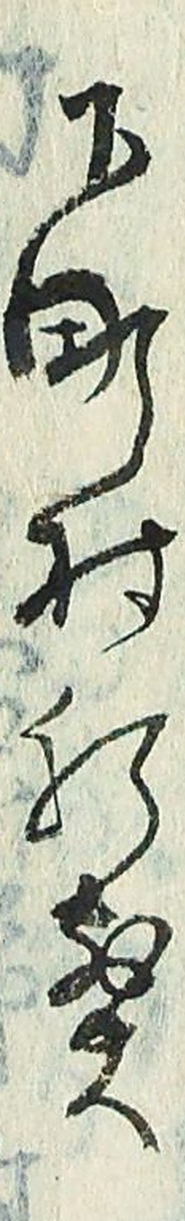下町村肝煎
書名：公辺御役人為御廻浦御立越諸御用一巻
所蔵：鳴門教育大学 Naruto University of Education
